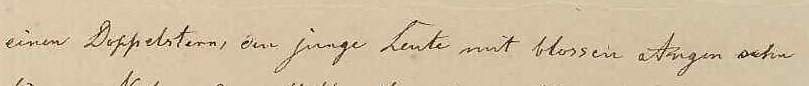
einen Doppelstern, den junge Leute mit blossen Augen sehn
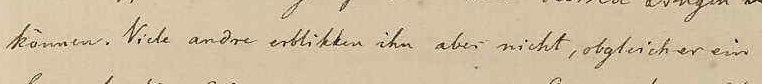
können. Viele andre erblikken ihn aber nicht, obgleich er ein
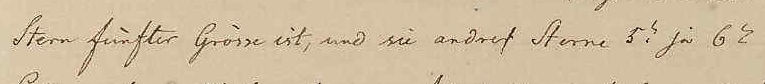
Stern fünfter Grösse ist, und sie andrer Sterne 5￼ ja 6￼
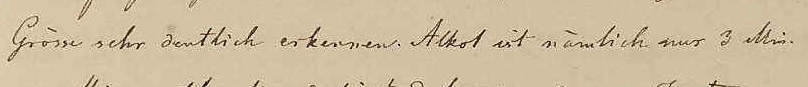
Grösse sehr deutlich erkennen. Alkol ist nämlich nur 3 Min.
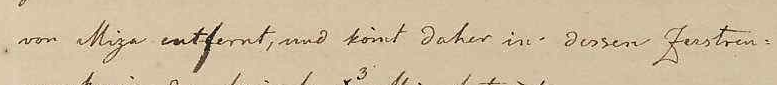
von Miza entfernt, und kömt daher in dessen Zerstreu-
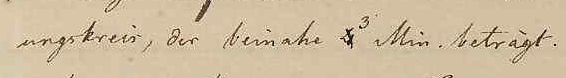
ungskreis, der beinahe 43 Min. beträgt.
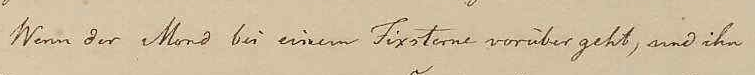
Wenn der Mond bei einem Fixsterne vorüber geht, und ihn
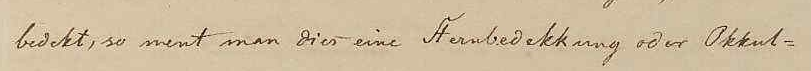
bedekt, so nent man dies eine Sternbedekkung oder Okkul-
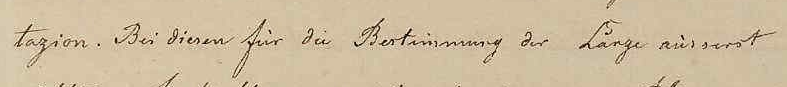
tazion. Bei diesen für die Bestimmung der Länge äusserst
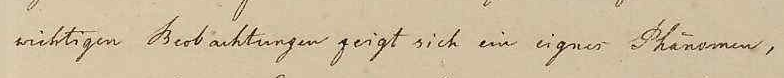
wichtigen Beobachtungen zeigt sich ein eignes Phänomen,
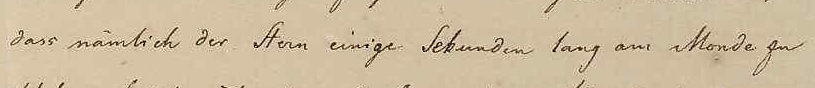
dass nämlich der Stern einige Sekunden lang am Monde zu
